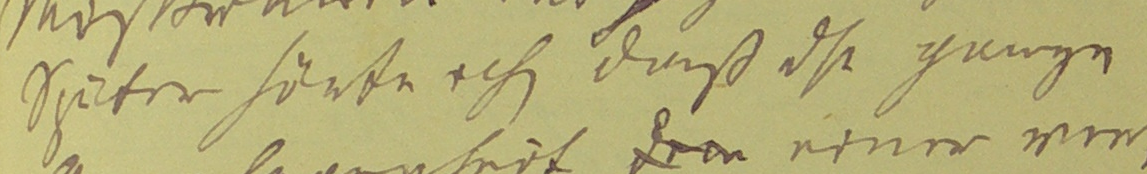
Später hörte ich daß diese ganze
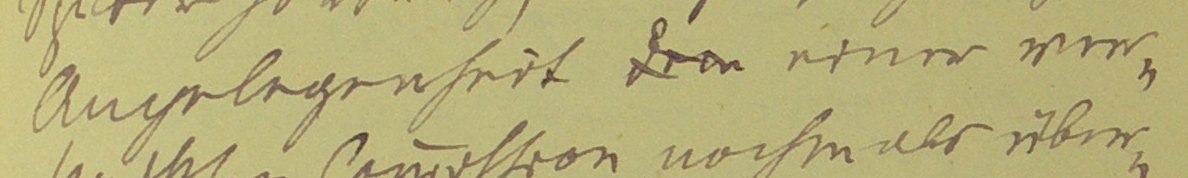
Angelegenheit einer ver¬
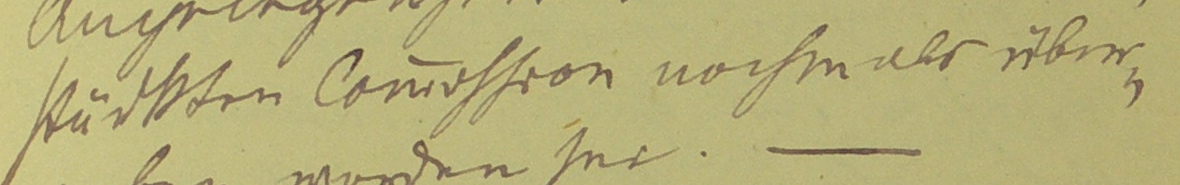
stärkten Commission nochmals über¬
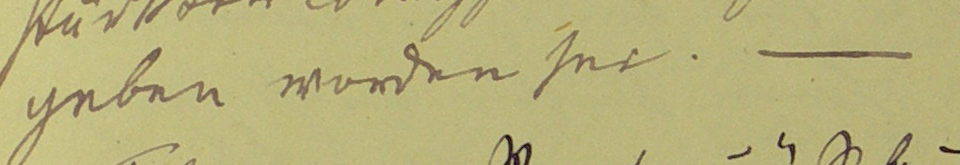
geben worden sei.—
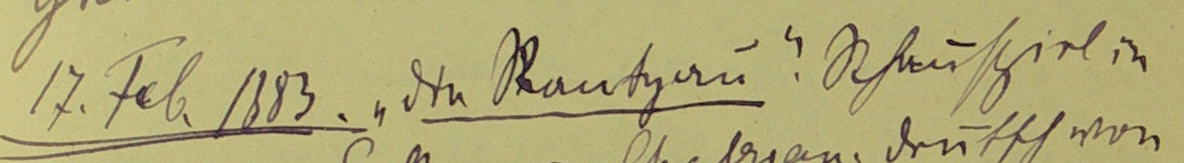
17. Februar . “Die Rantzen“… Schauspiel in
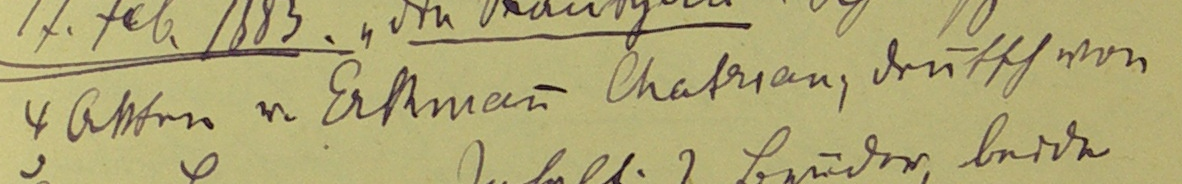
4 Akten von Erkmann Chateriau; , deutsch von
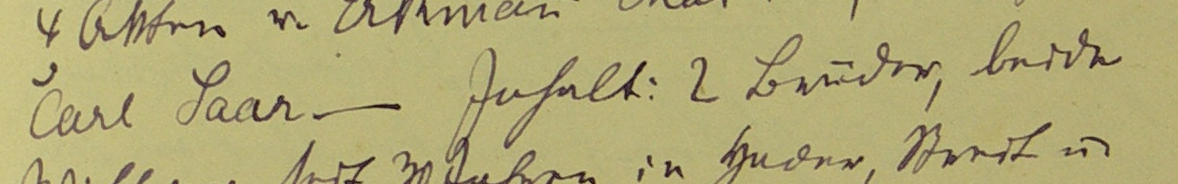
Carl Saar.- Inhalt: 2 Brüder, beide
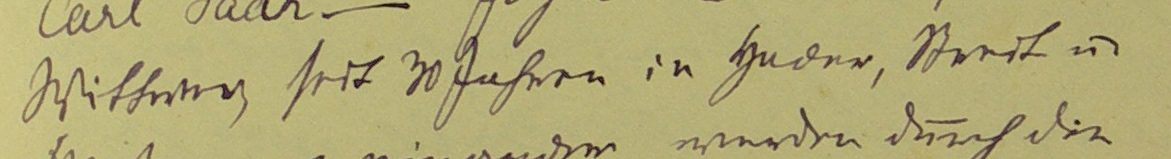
Witwer, seit 30 Jahren in Hader, Streit und
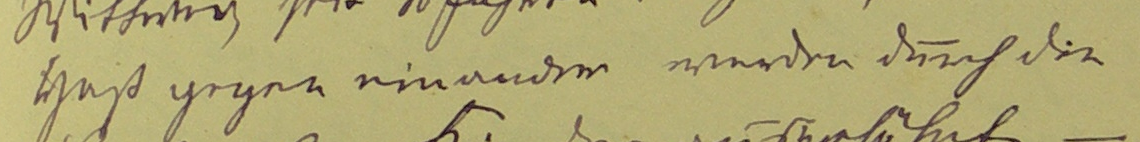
Haß gegen einander wurden durch die
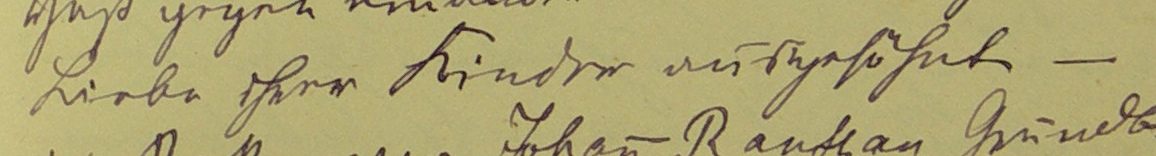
Liebe ihrer Kinder ausgesöhnt—
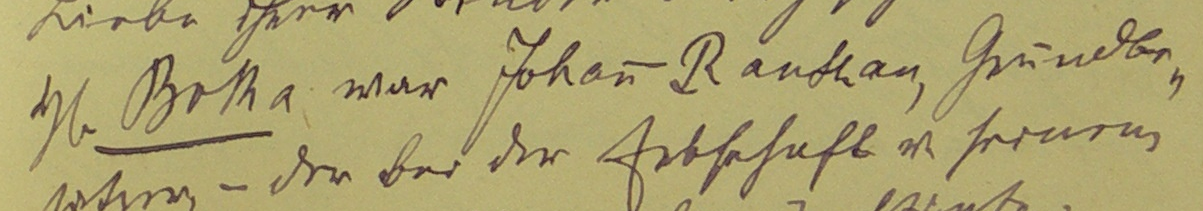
Herr Boka war Johann Ranthan, Grundbe¬
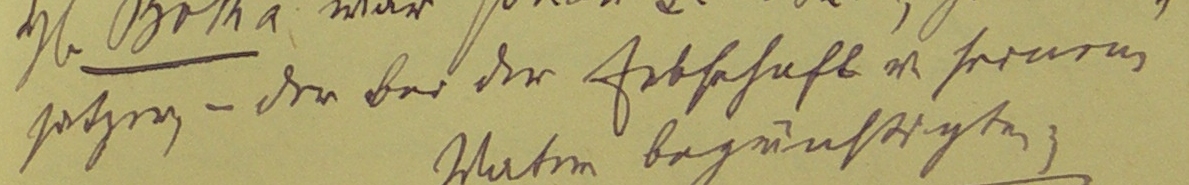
sitzerr- der bei der Erbschaft von seinem
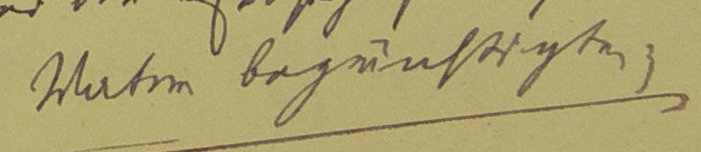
Vater begünstigte,
